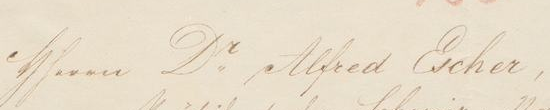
Herrn Dr Alfred Escher,
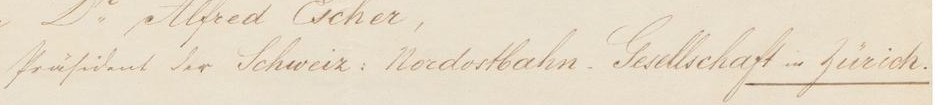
Präsident der Schweiz. Nordostbahn-Gesellschaft in Zürich.
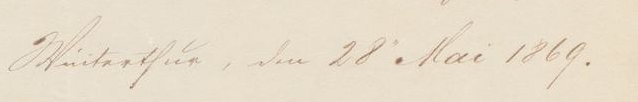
Winterthur, den 28 Mai 1869.
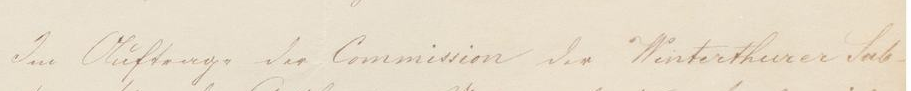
Im Auftrage der Commission der Winterthurer Sub--
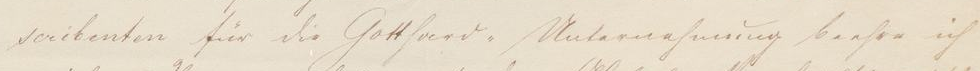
scribenten für die Gotthard-Unternehmung beehre ich
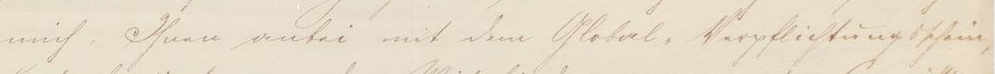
mich, Ihnen anbei mit dem Global-Verpflichtungsschein,
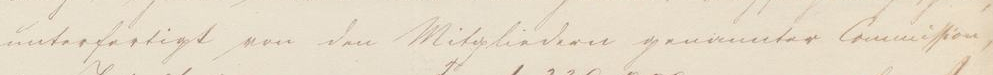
unterfertigt von den Mitgliedern genannter Commission,
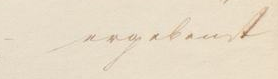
ergebenst
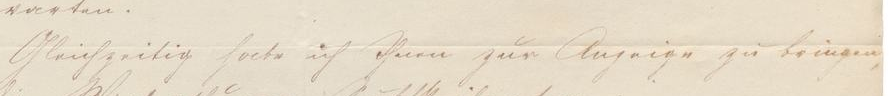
Gleichzeitig habe ich Ihnen zur Anzeige zu bringen,
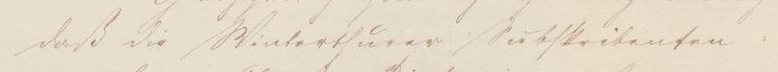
daß die Winterthurer Subskribenten
